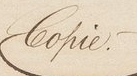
Copie.
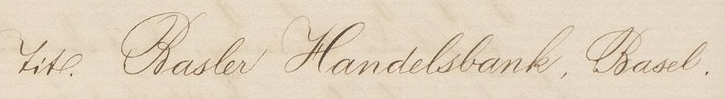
Tit. Basler Handelsbank, Basel.
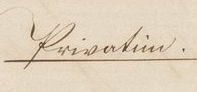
Privatim.
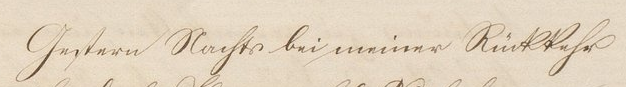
Gestern Nachts bei meiner Rückkehr
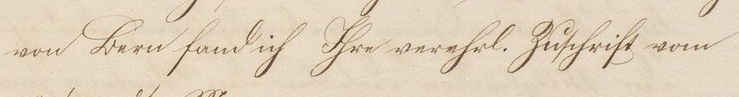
von Bern fand ich Ihre verehrl. Zuschrift vom
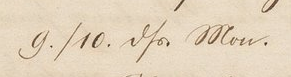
9./10. dss. Mon.
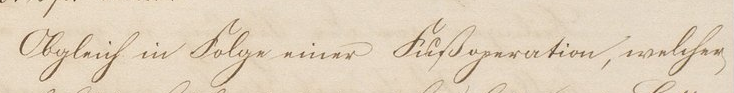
Obgleich in Folge einer Fußoperation, welcher
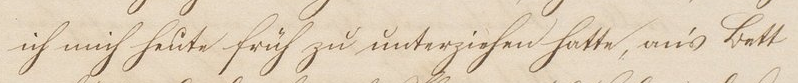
ich mich heute früh zu unterziehen hatte, an's Bett
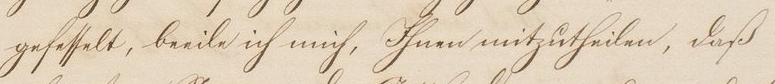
gefesselt, beeile ich mich, Ihnen mitzutheilen, daß
